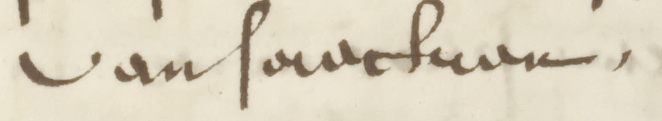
van saecken.
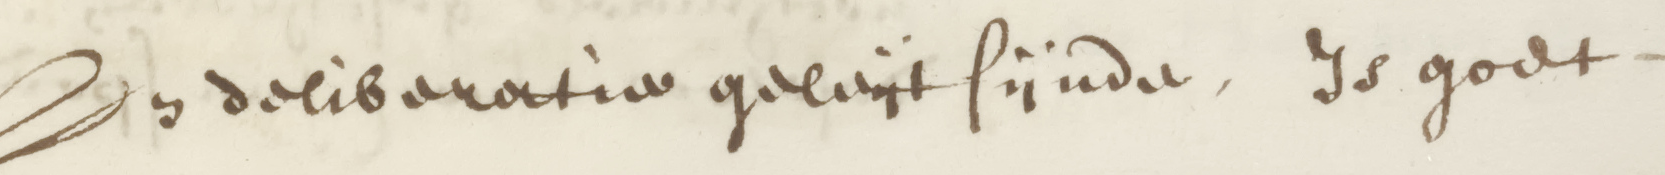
In deliberatie geleijt sijnde, Is goet
